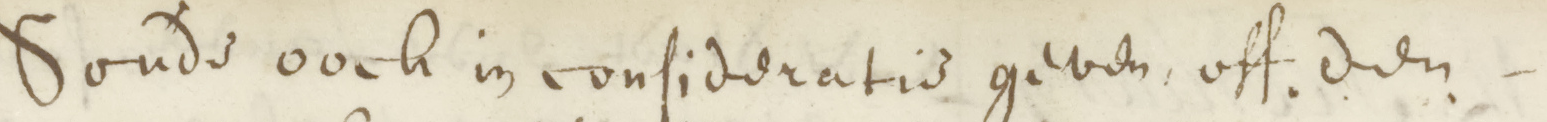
Soude oock in consideratie geven, off den
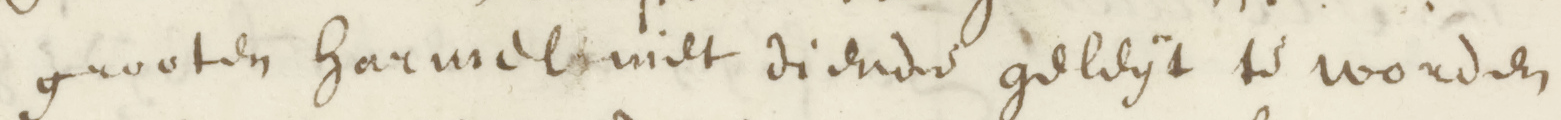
grooten harmel niet diende geleijt te worden
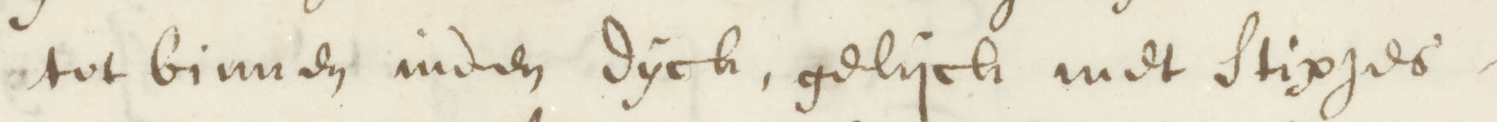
tot binnen inden dijck, gelijck met stipjes
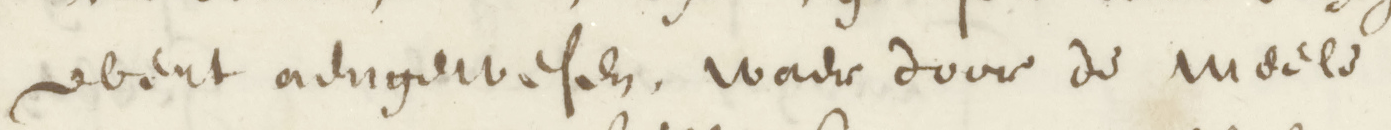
wert aengewesen, waer door de Meele
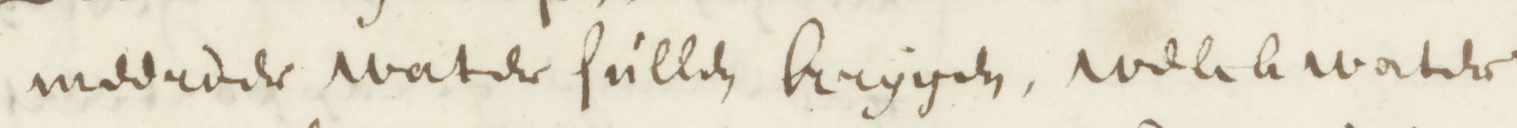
meerder water sullen krijgen, welck water
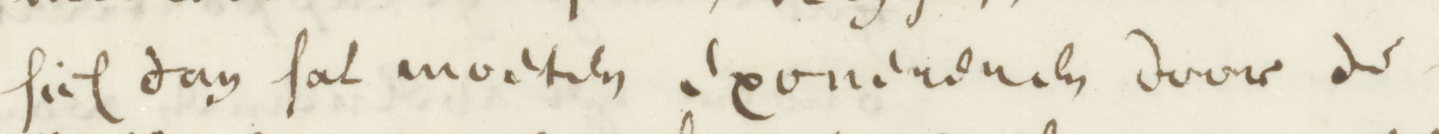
sich dan sal moeten exonereren door de
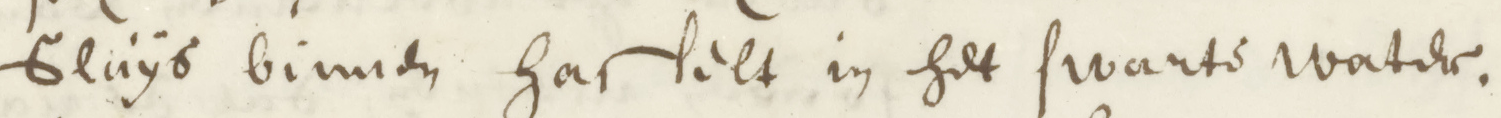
Sluijs binnen hasselt in het swarte water,
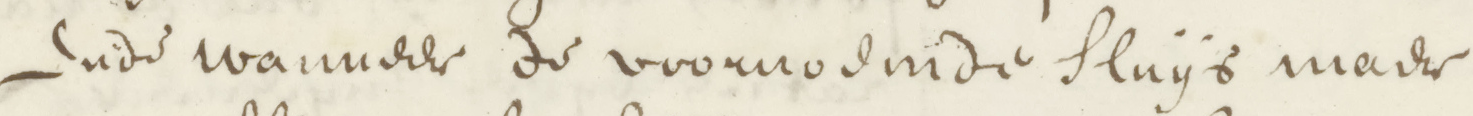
ende wanneer de voornoemde sluijs maer
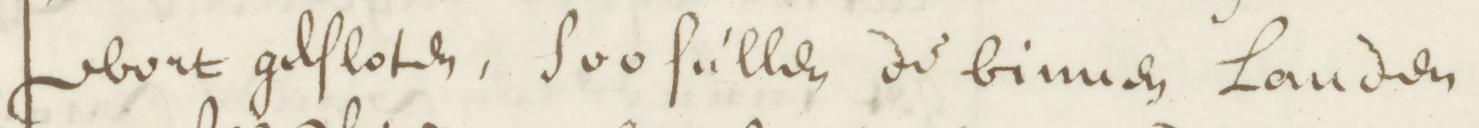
wort gesloten, soo sullen de binnen Landen
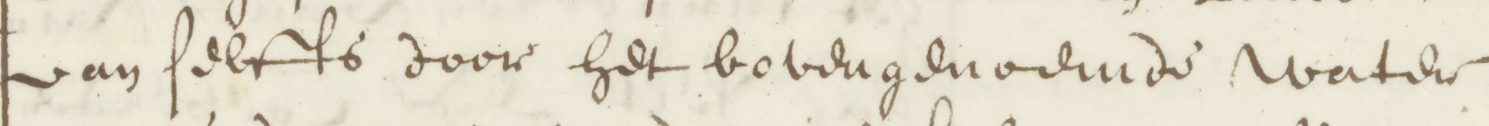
van selffs door het bovengenoemde water
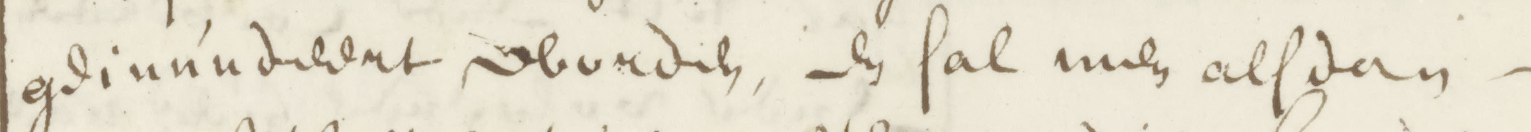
geinundeert worden, en sal men alsdan
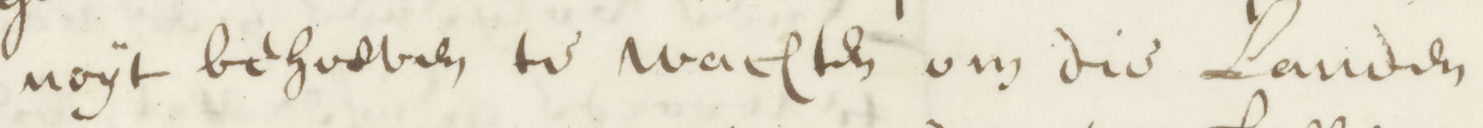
noijt behoeven te wachten om die Landen
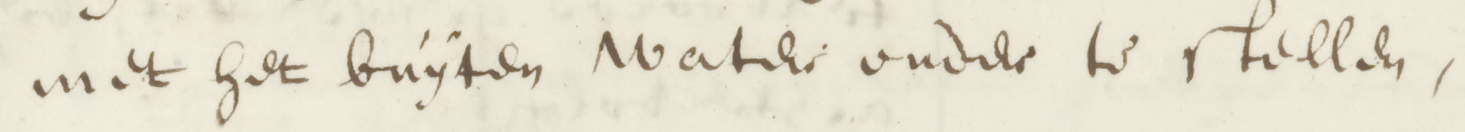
met het buijten water onder te stellen.
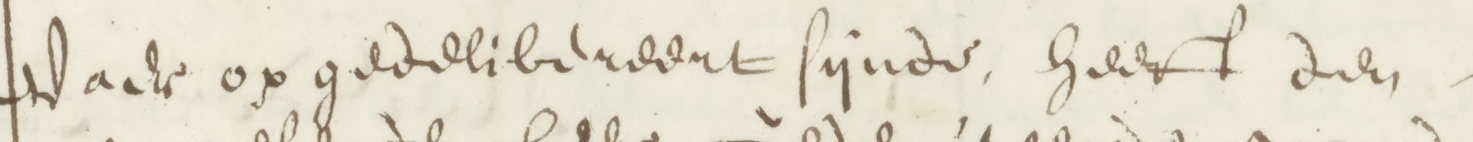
Waer op gedelibereert sijnde, heeft den
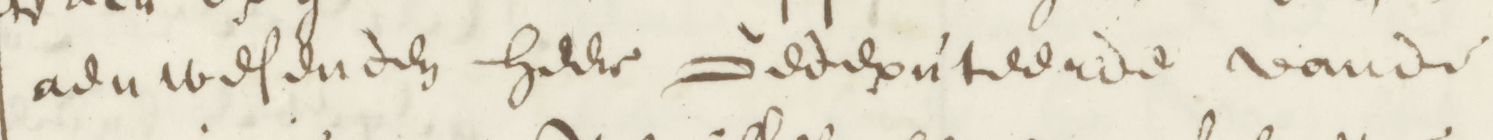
aenwesenden heer Gedeputeerde vande
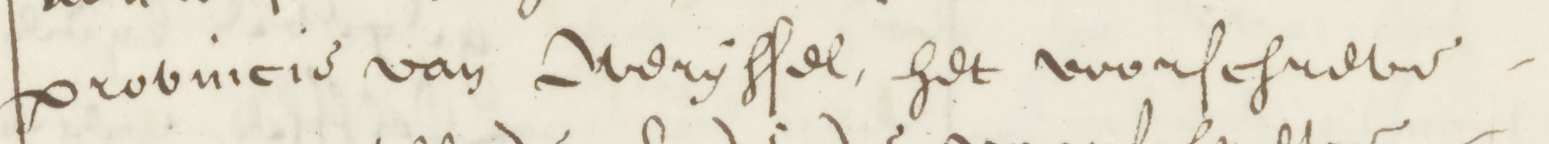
provincie van Overijssel, het voorschreve
